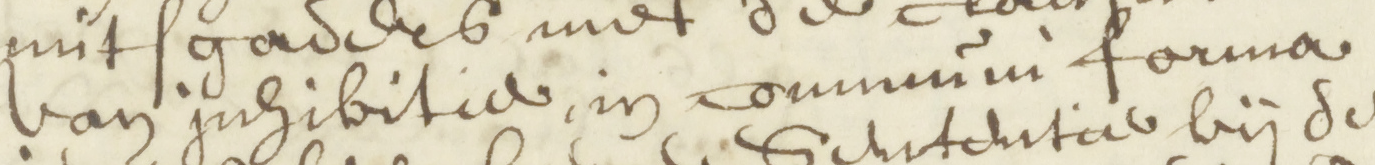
van inhibitie, in communi forma
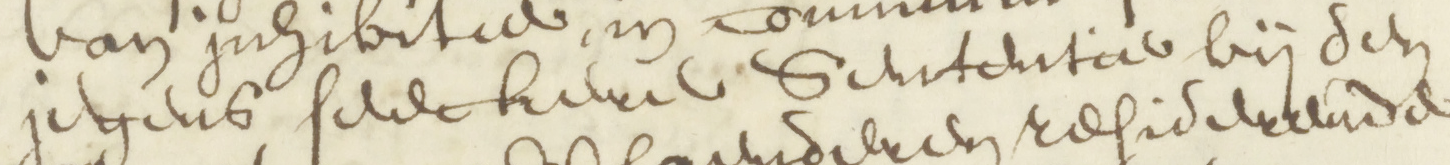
jegens seeckere Sententie bij den
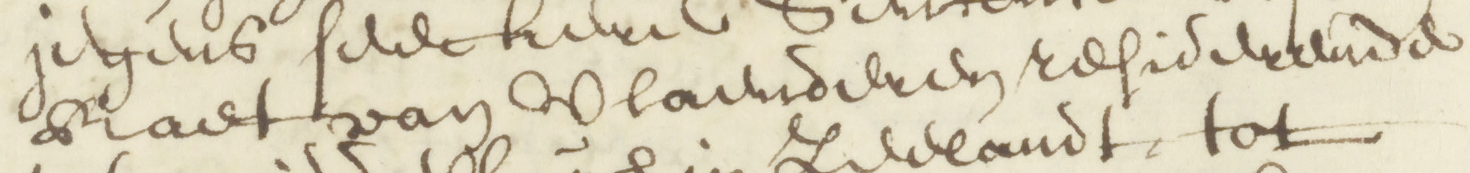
Raet van Vlaenderen residerende
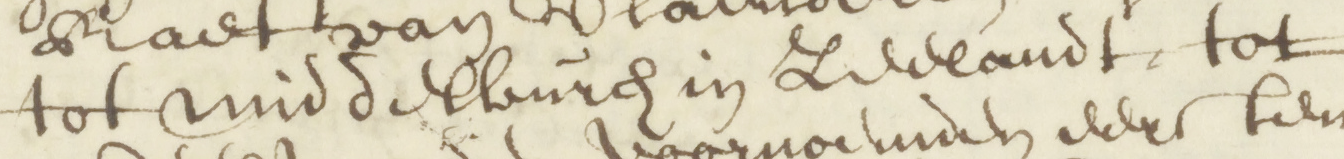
tot Middelburch in Zeelandt, tot
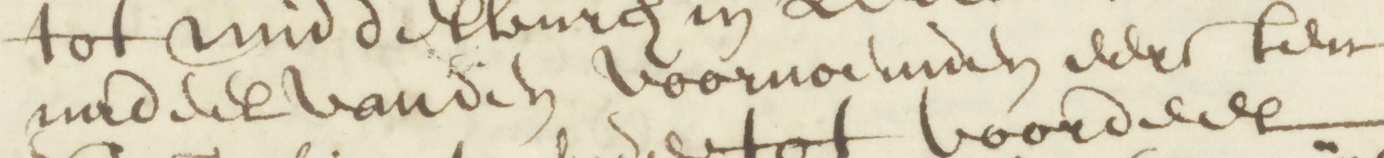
nadeel vanden voornoemden eersten
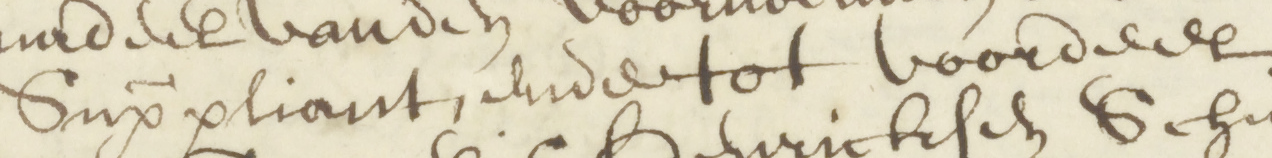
Suppliant, ende tot voordeel
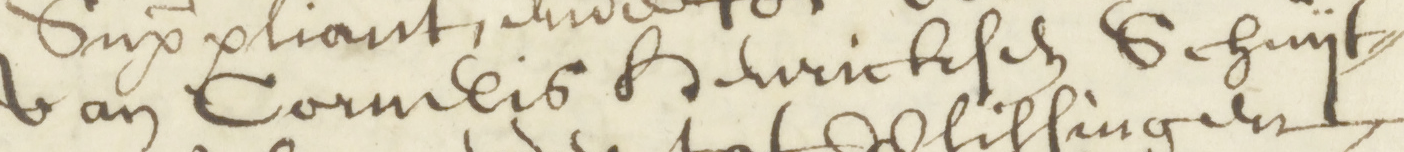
van Cornelis Henricksen Schuijt„
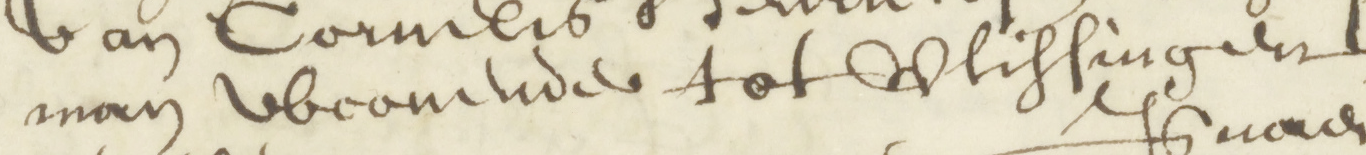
man woonende tot Vlissingen
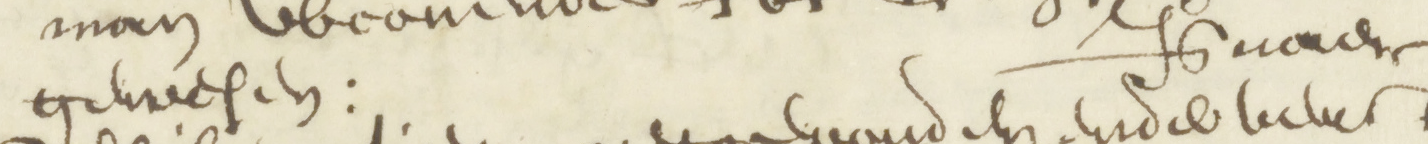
gewesen: Is naer
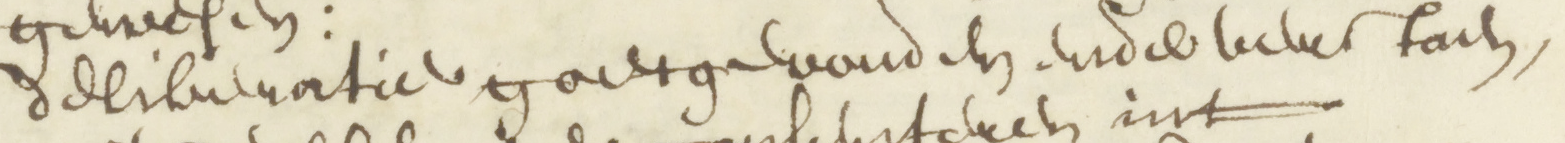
deliberatie goetgevonden ende verstaen,
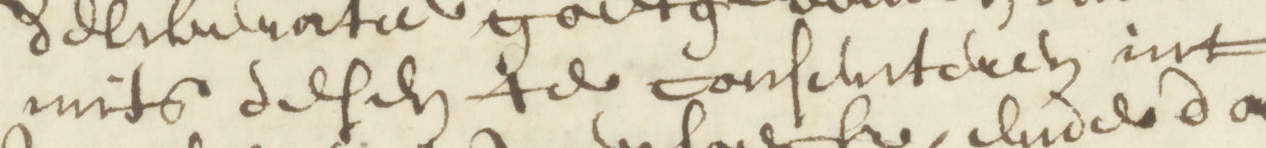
mits desen te consenteren int
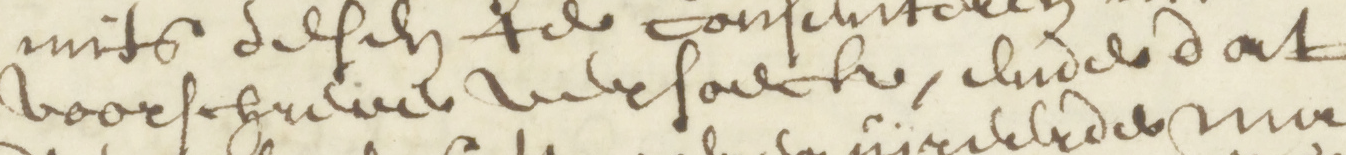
voorschreve versoeck, ende dat
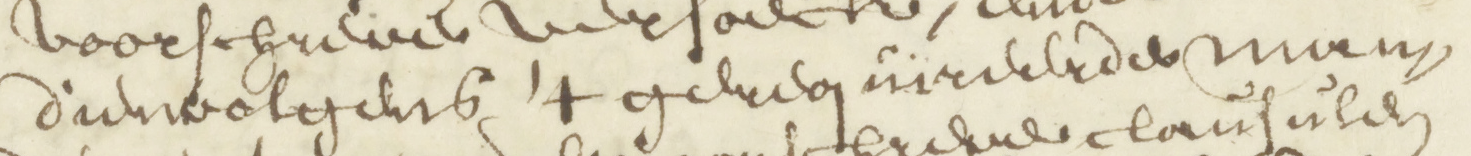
dienvolgens 't gerequireerde man,,
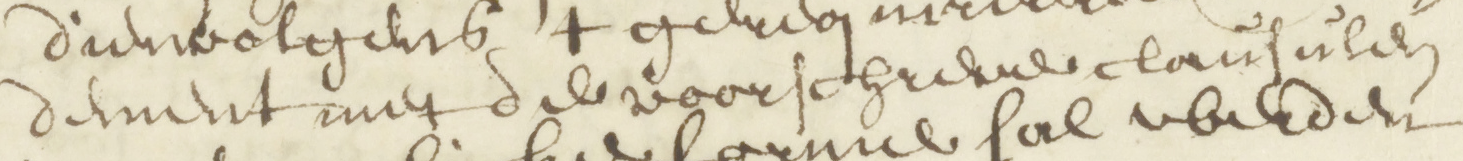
dement met de voorschreve clausulen
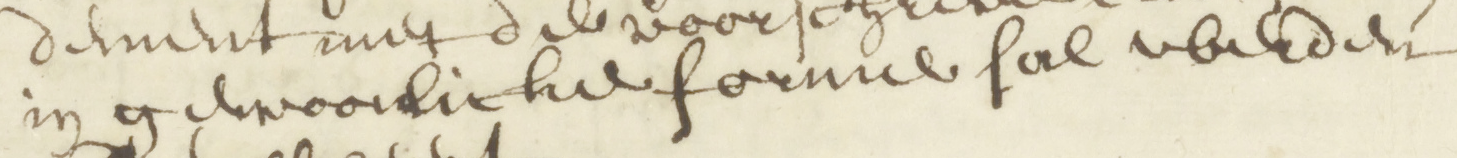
in gewoonlicke forme sal werden
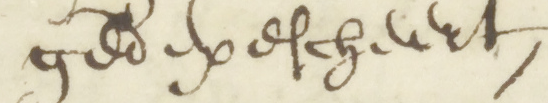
gedepescheert
